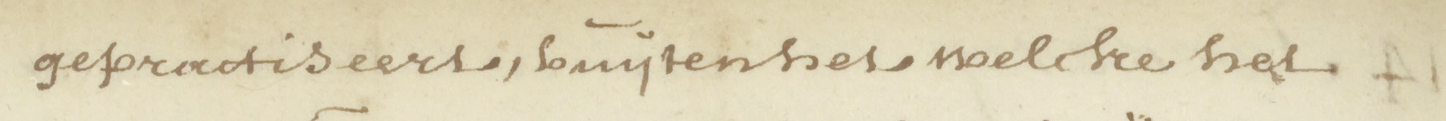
gepractiseert, buijten het welcke het
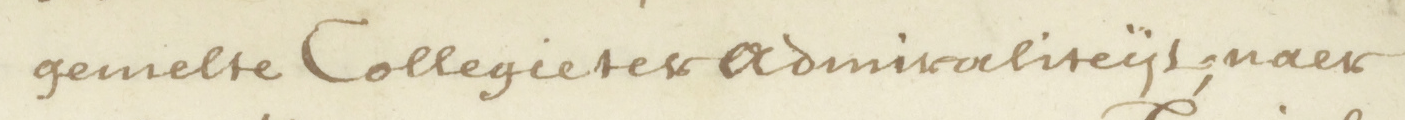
gemelte Collegie ter Admiraliteijt, naer
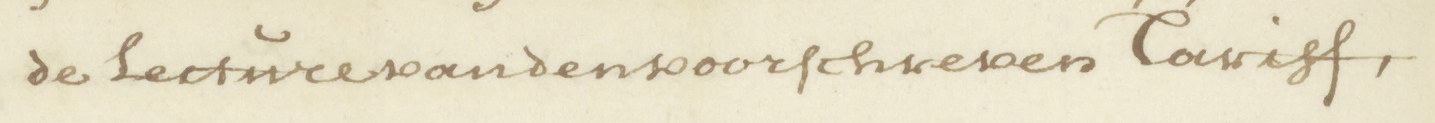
de lecture vanden voorschreven Tariff,
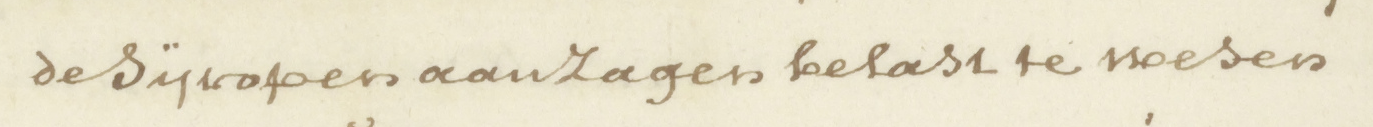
de sijropen aanzagen belast te wesen
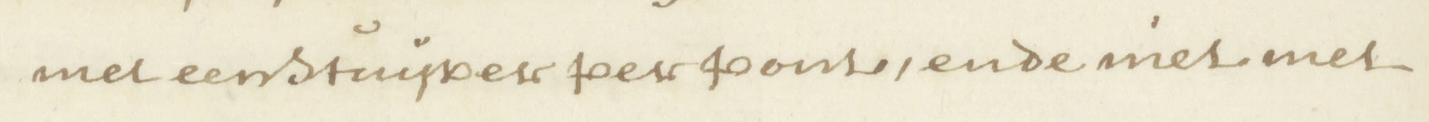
met een stuijver per pout, ende niet met
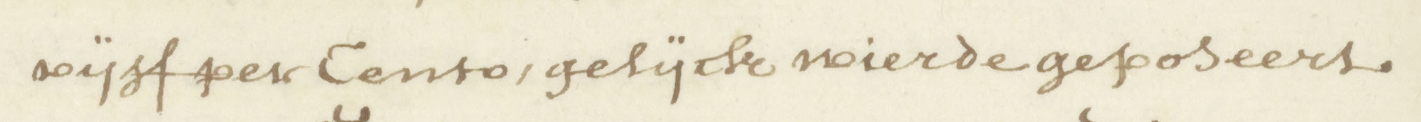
vijff per cento, gelijck wierde geposeert
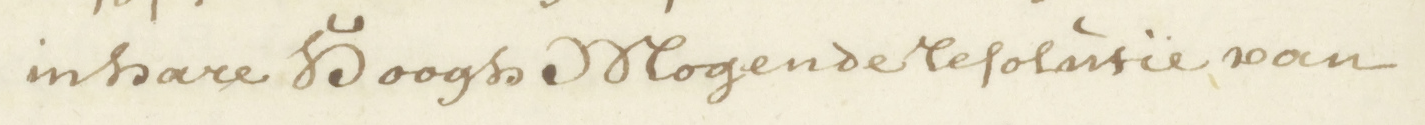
in hare Hoogh Mogende resolutie van
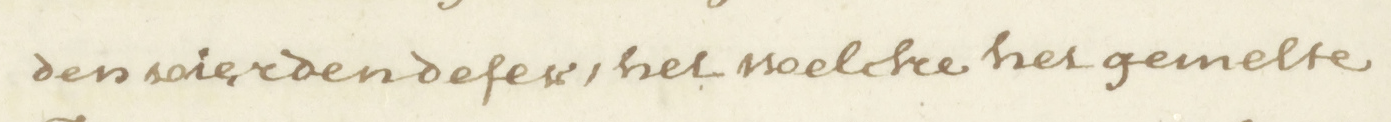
den vierden deser, het welcke het gemelte
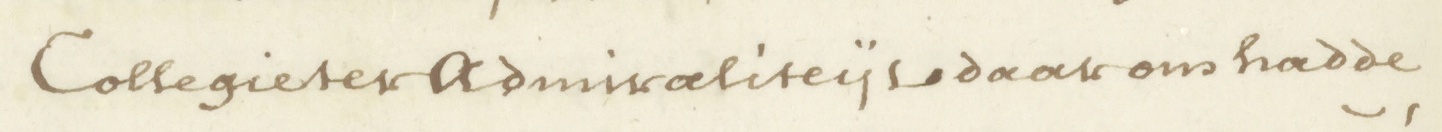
Collegie ter Admiraliteijt daarom hadde
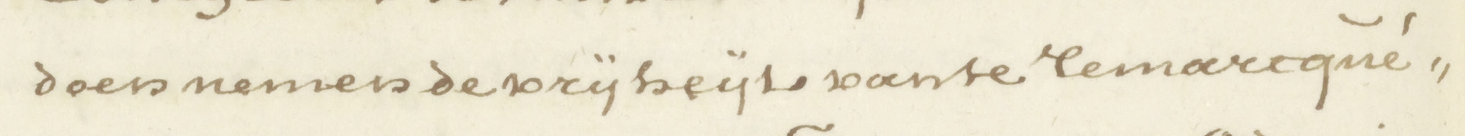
doen nemen de vrijheijt van te remarcque„
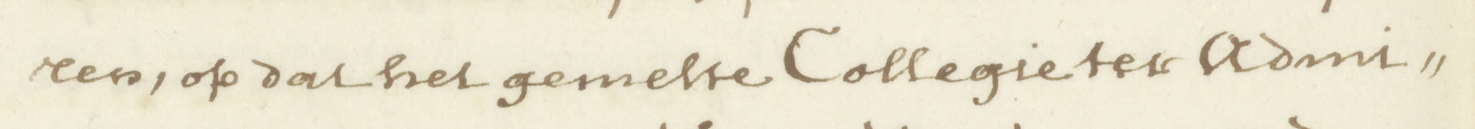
ren, op dat het gemelte Collegie ter Admi„
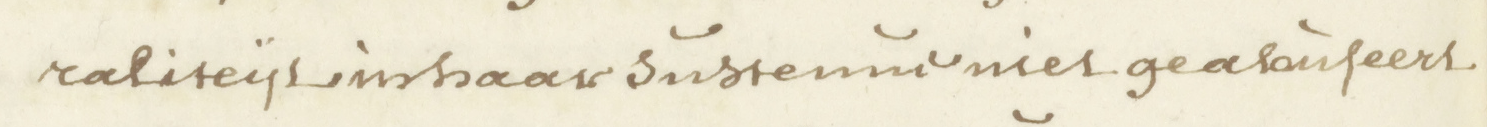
raliteijt in haar sustenue niet geabuseert
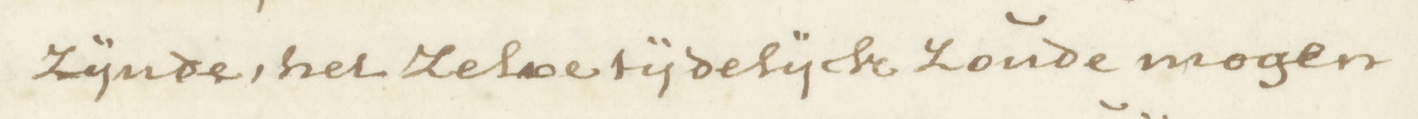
zijnde, het zelve tijdelijck zoude mogen
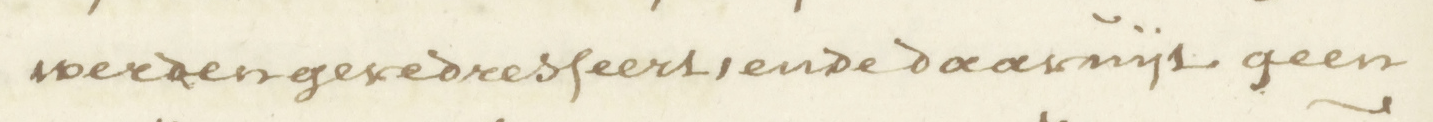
werden geredresseert, ende daaruijt geen
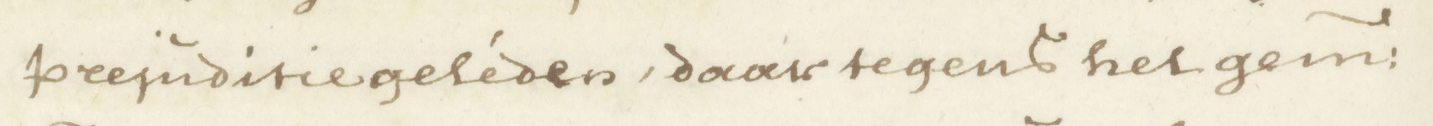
prejuditie geleden, daar tegens het gem:
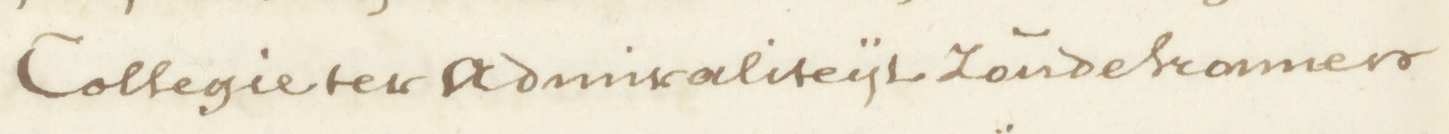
Collegie ter Admiraliteijt zoude konnen
